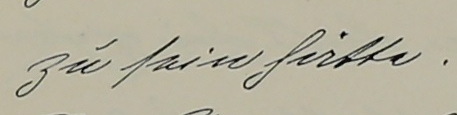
zu sein hätte.
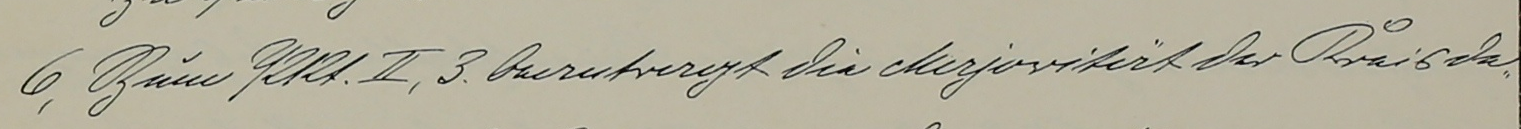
6. Zum Pkt. II.3. beantragt die Majorität der Kreisde-
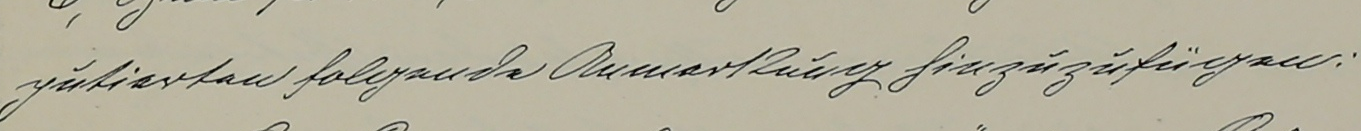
putierten folgende Anmerkung hinzuzufügen:
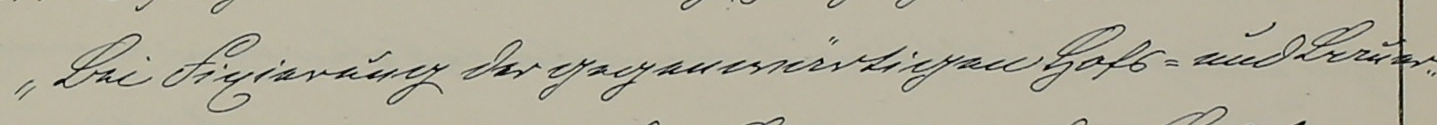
„Bei Fixierung der gegenwärtigen Hofs- und Bauer-
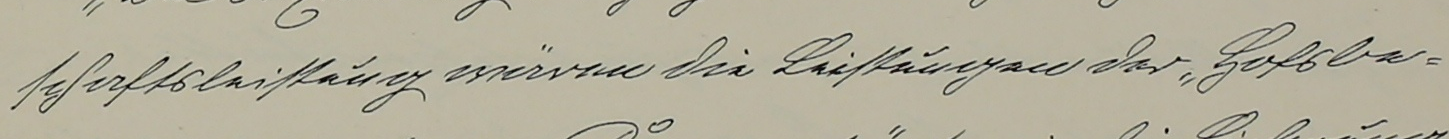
schaftsleistung wären die Leistungen der „Hofsbe-
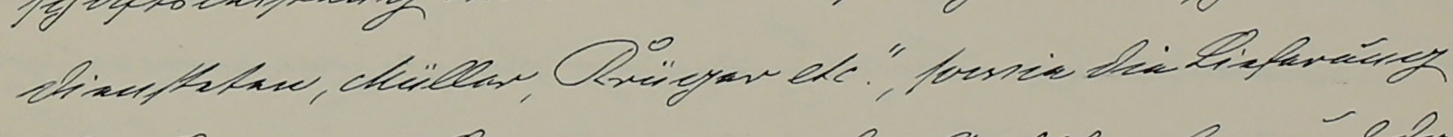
diensteten, Müller, Krüger etc.“, sowie die Lieferung
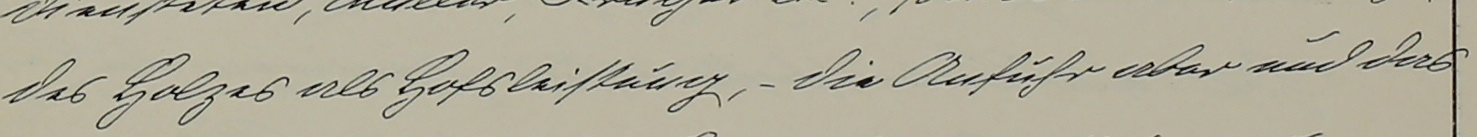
des Holzes als Hofsleistung, - die Anfuhr aber und das
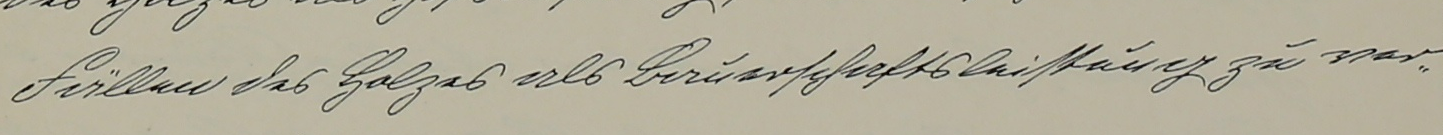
Fällen des Holzes als Bauerschaftsleistung zu ver-
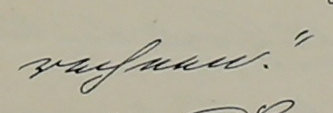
rechnen.“
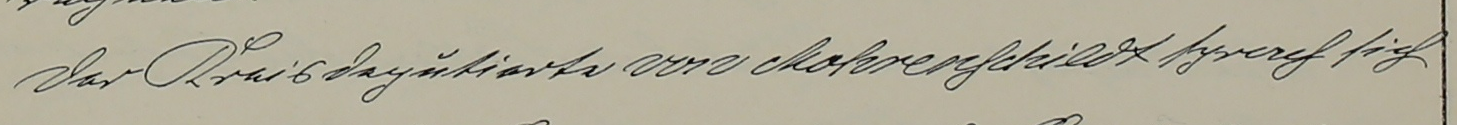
Der Kreisdeputierte von Mohrenschildt sprach sich
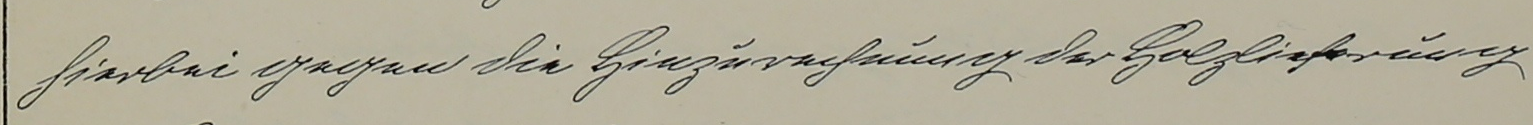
hierbei gegen die Hinzurechnung der Holzlieferung
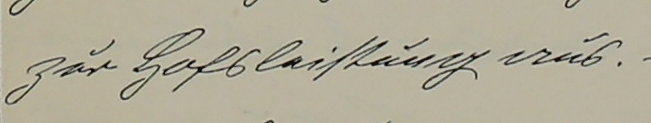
zur Hofsleistung aus.
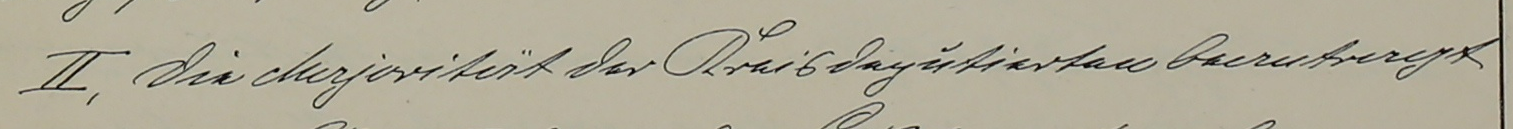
II. Die Majorität der Kreisdeputierten beantragt
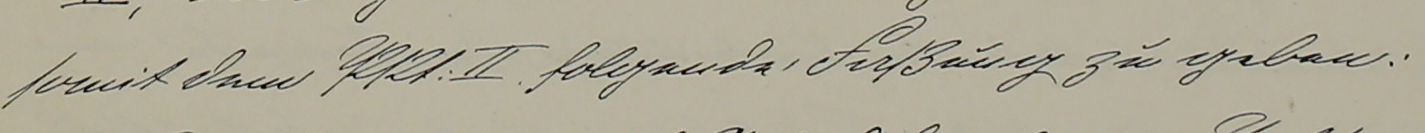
somit, dem Pkt. II. folgende Faßung zu geben:
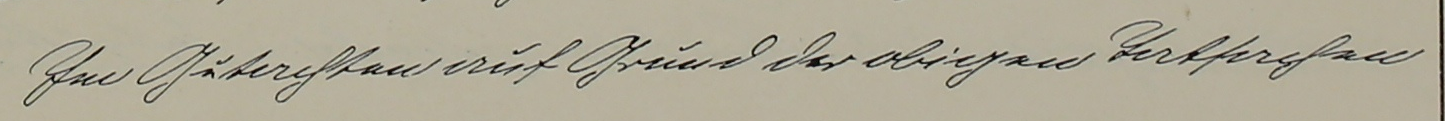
Im Gutachten auf Grund der obigen Tatsachen
